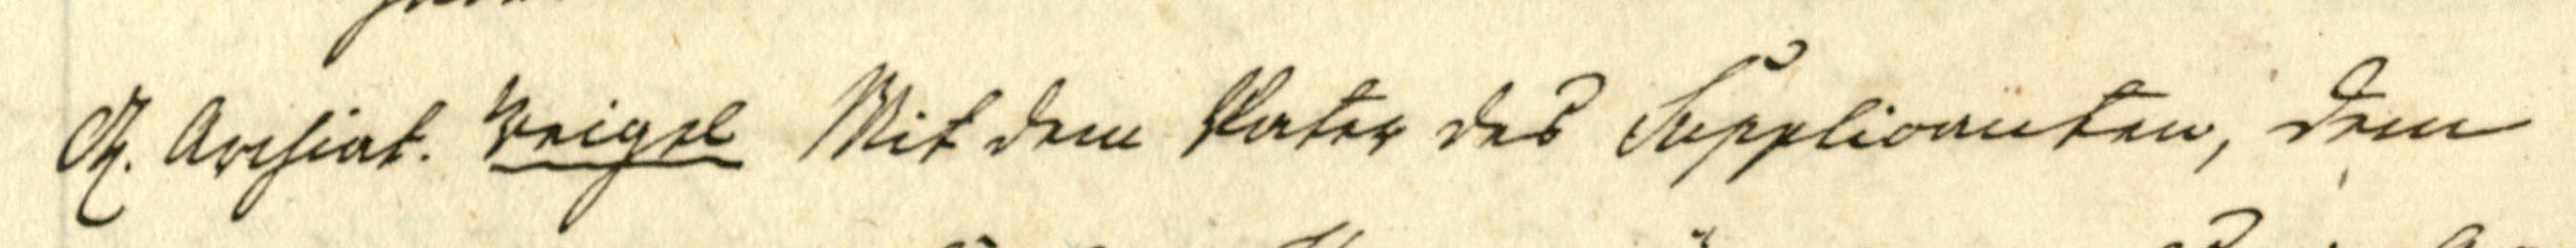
dh. Archiat. Weigel. Mit dem Vater des Supplicanten, dem
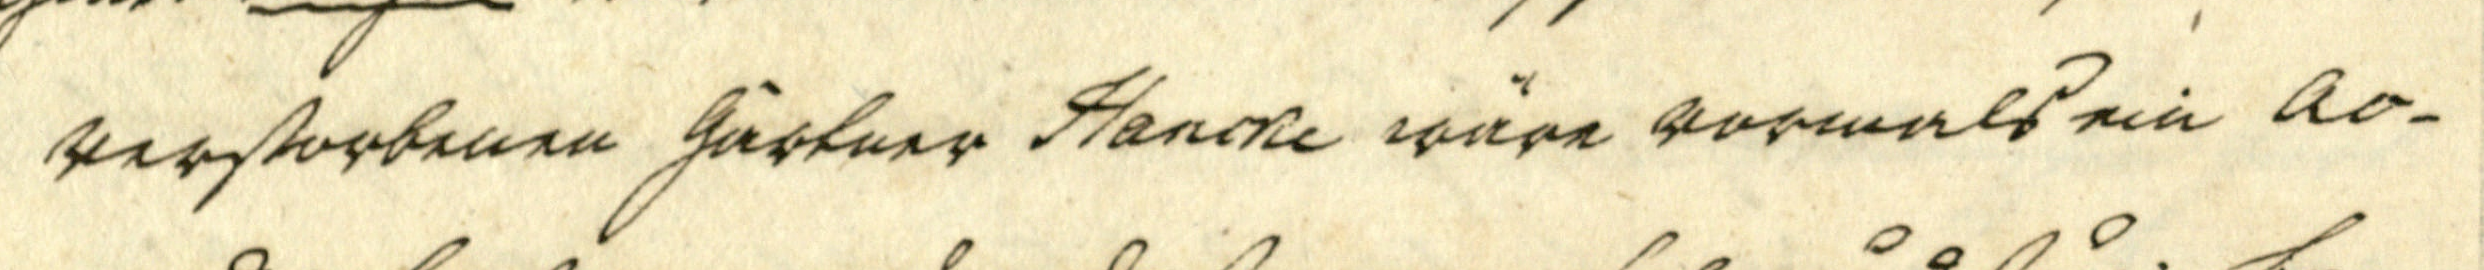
verstorbenen Gärtner Hancke wäre vormals ein Ac¬
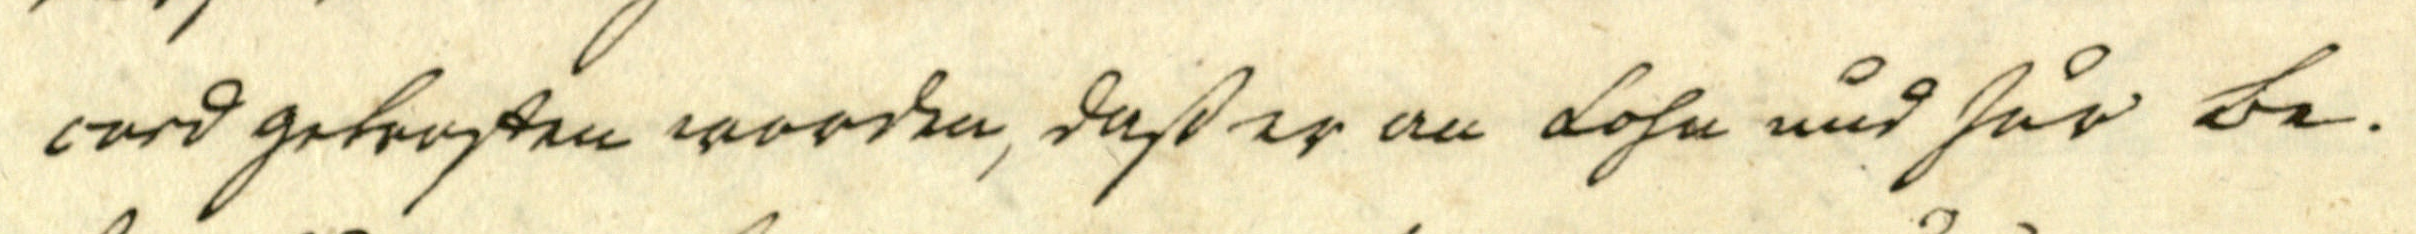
cord getroffen worden, daß er an Lohn und zur Be¬
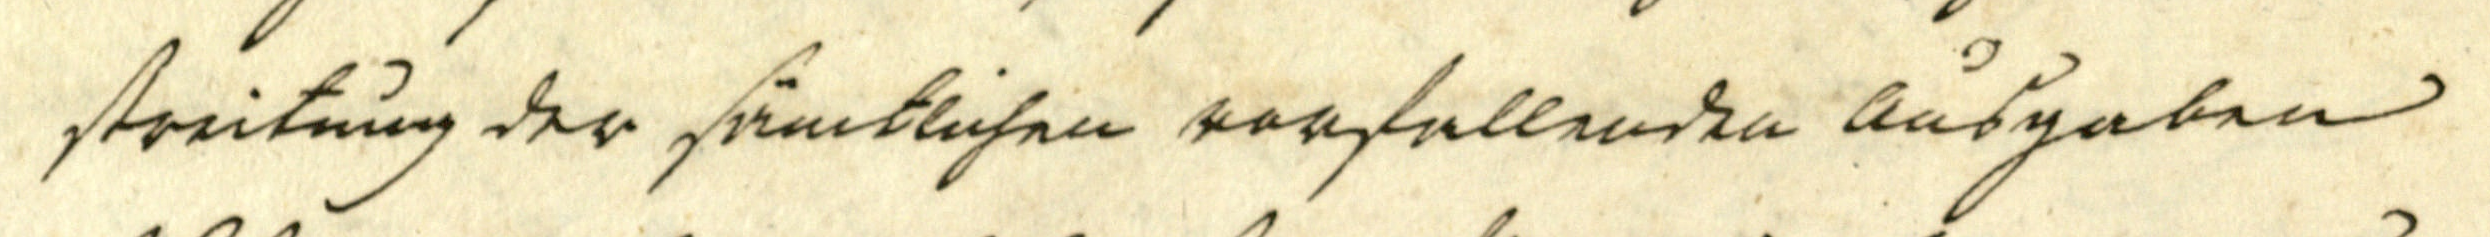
streitung der sämtlichen vorfallenden Ausgaben
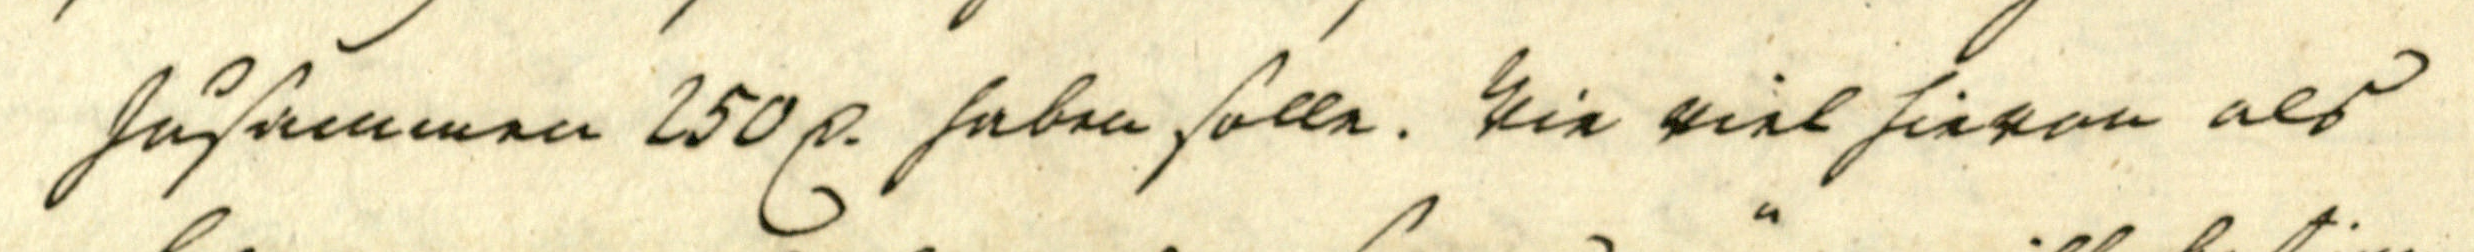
zusammen 250 l. haben solle. Wie viel hievon als
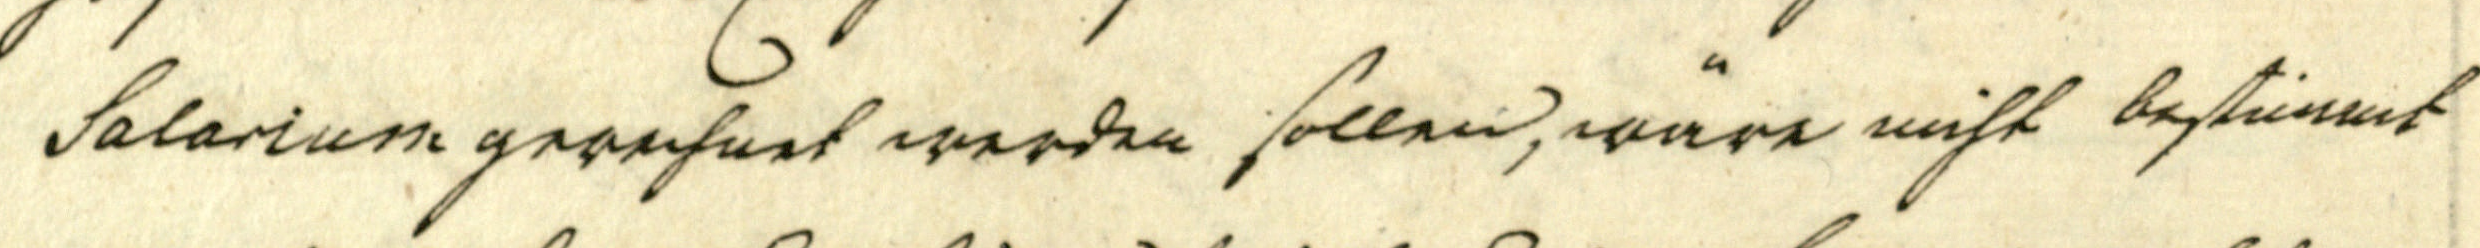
Salarium gerechnet werden sollen, wäre nicht bestimmt
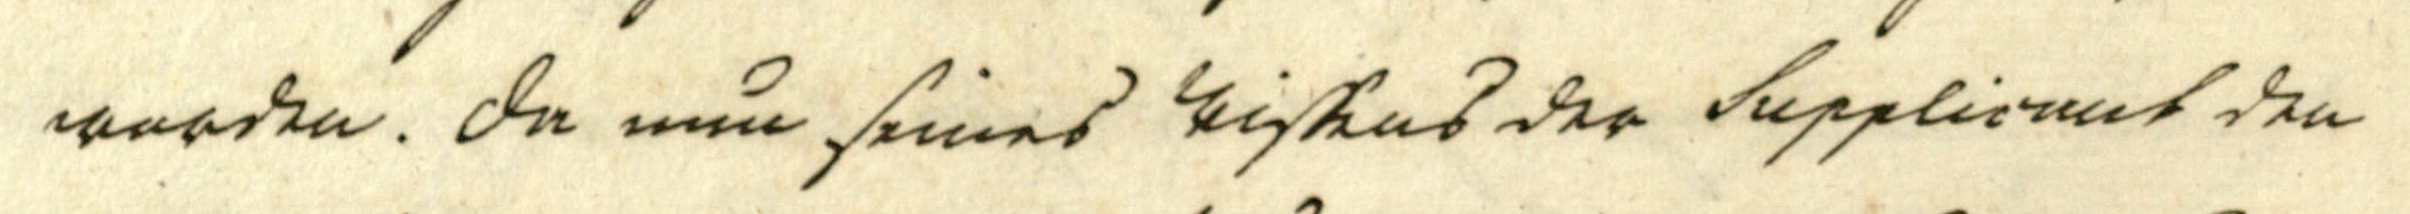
worden. Da nun seines Wissens der Supplicant den
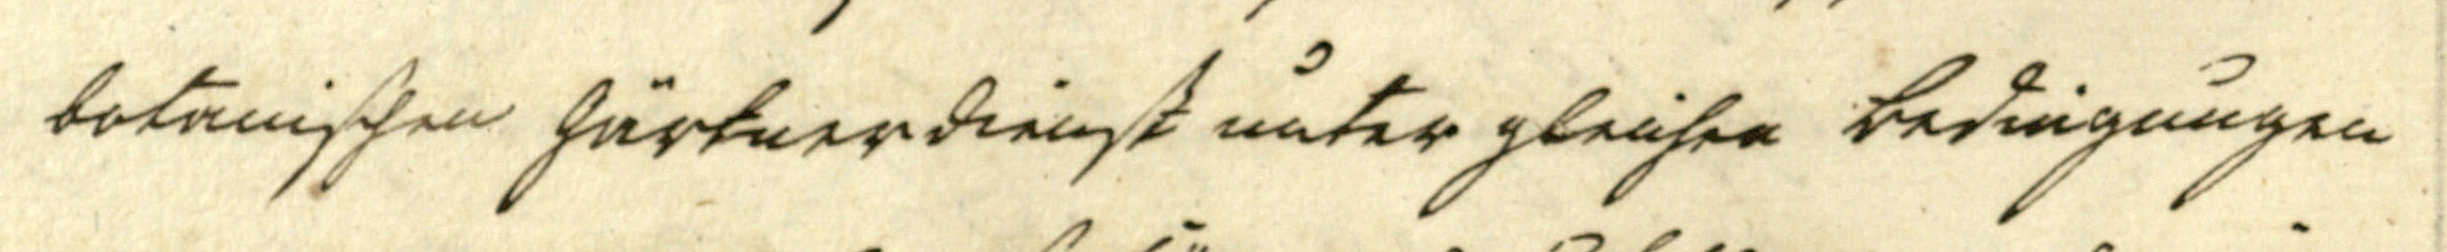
botanischen Gärtnerdienst unter gleichen Bedingungen
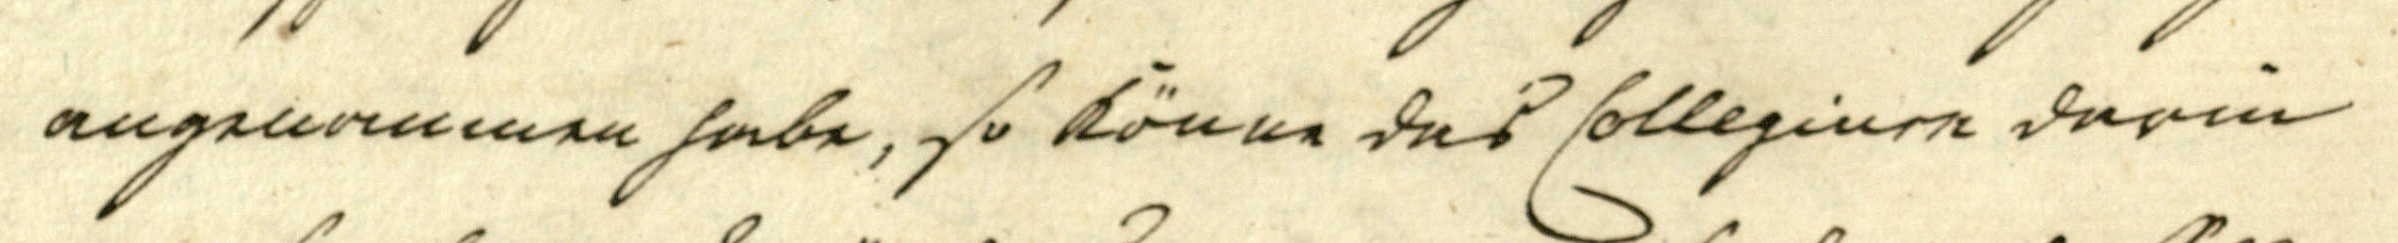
angenommen habe, so könne das Collegium darin
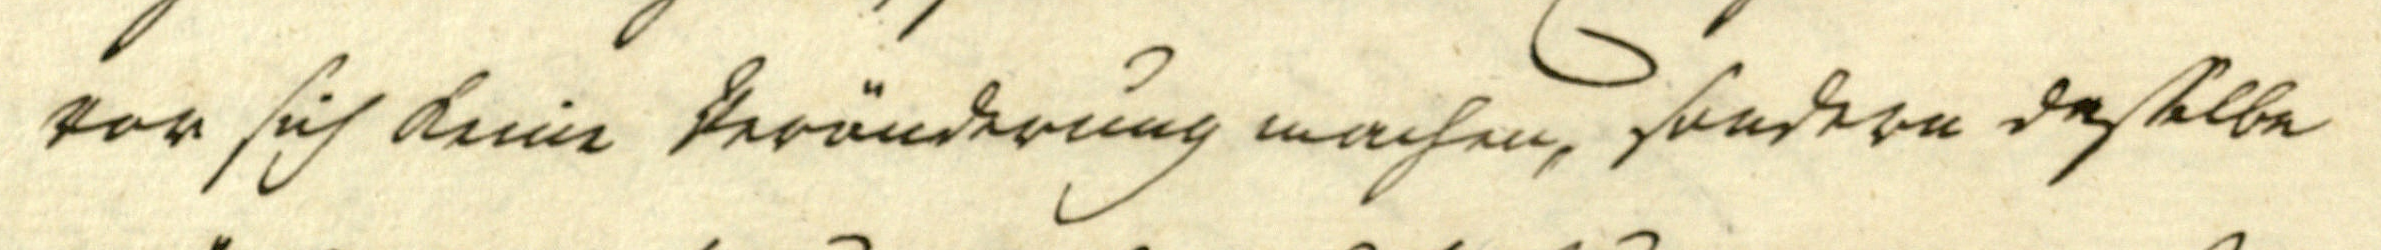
vor sich keine Veränderung machen, sondern dasselbe
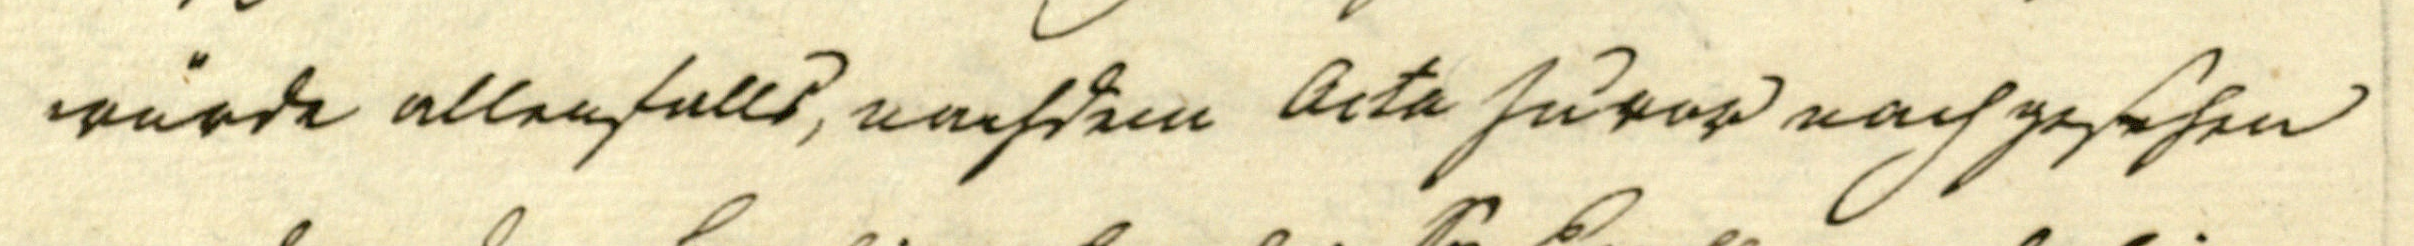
würde allenfalls, nachdem Acta zuvor nachgesehen
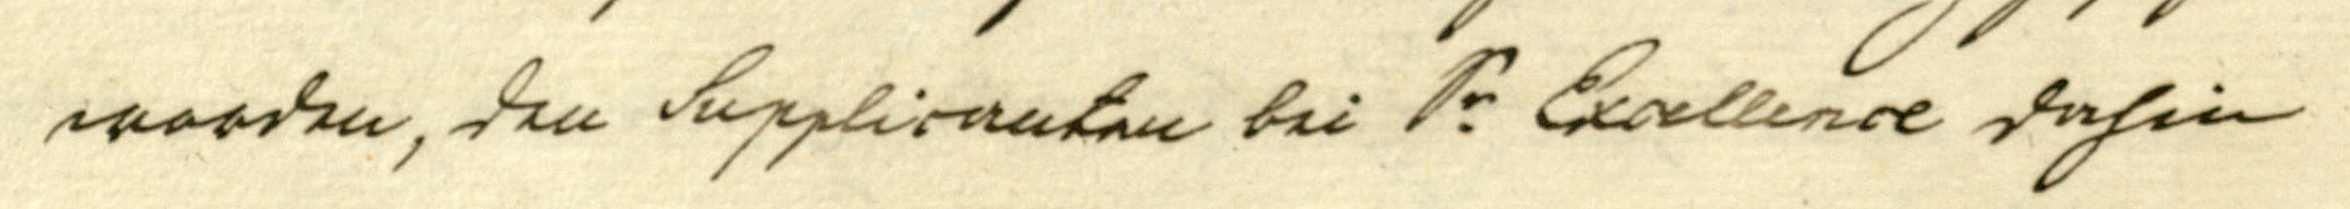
worden, den Supplicanten bei Sr Excellence dahin
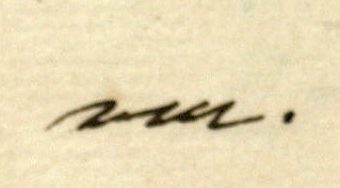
em
